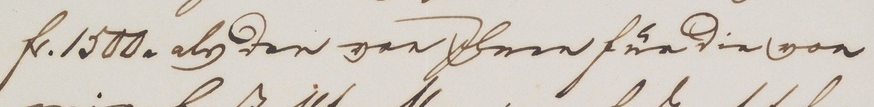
Fr. 1500. als den von Ihnen für die von
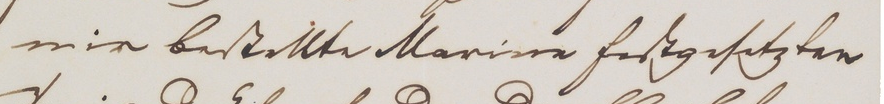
mir bestellte Marine festgesetzten
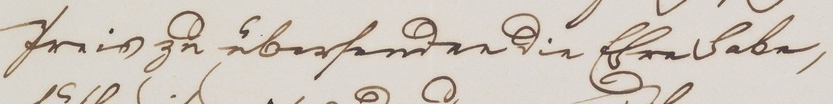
Preis zu übersenden die Ehre habe,
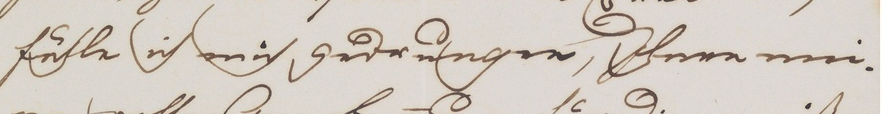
fühle ich mich gedrungen, Ihnen mei-
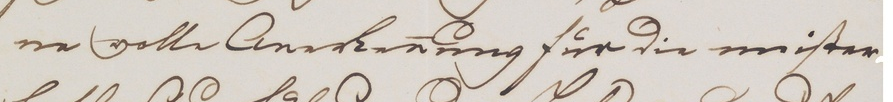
ne volle Anerkennung für die meister-
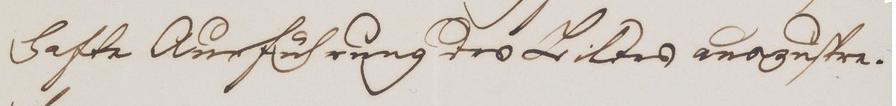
hafte Ausführung des Bildes auszuspre-
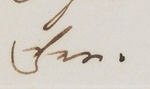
chen.
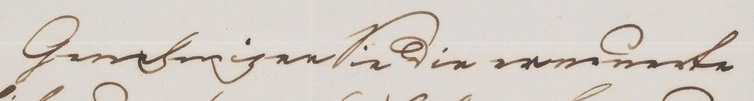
Genehmigen Sie die erneuerte
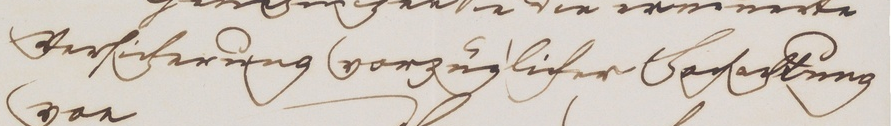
Versicherung vorzüglicher Hochachtung
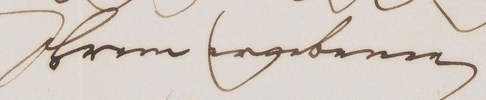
Ihrem ergebenen
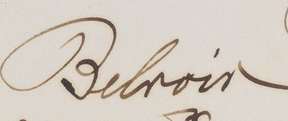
Belvoir
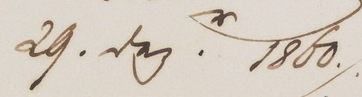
29. Dezr 1860.
